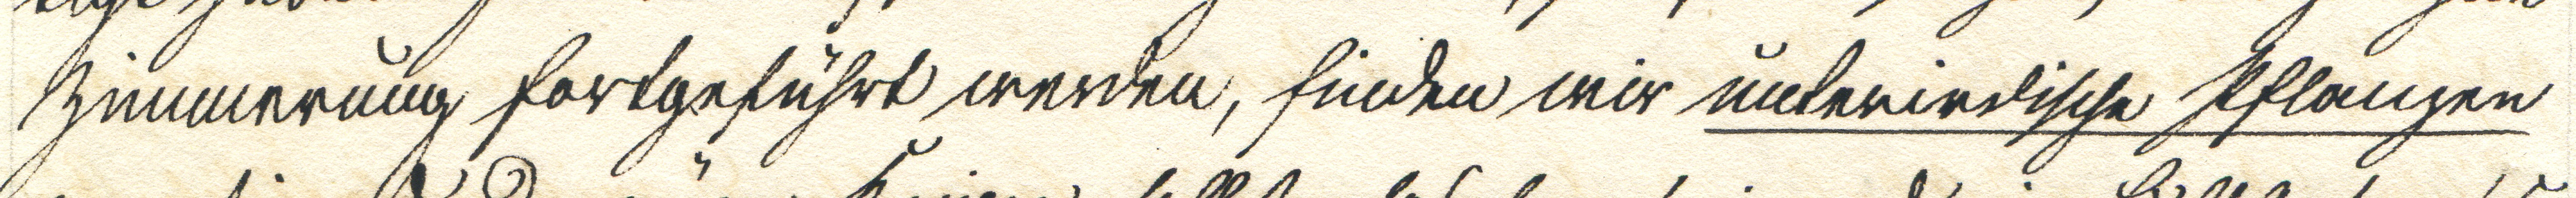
Zimmerung fortgeführt werden, finden wir unterirdische Pflanzen
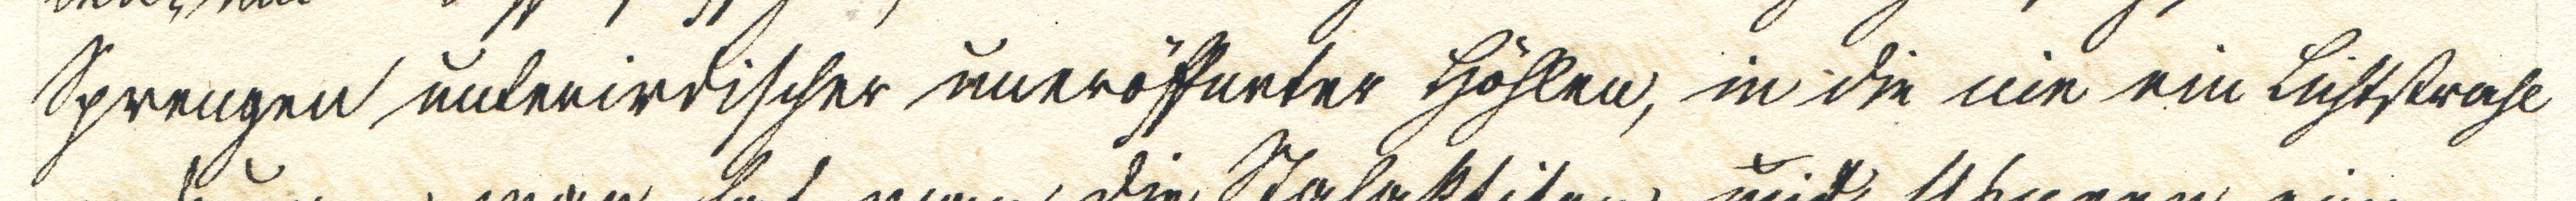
Sprengen unterirdischer uneröffneter Höhlen, in die nie ein Lichtstrahl
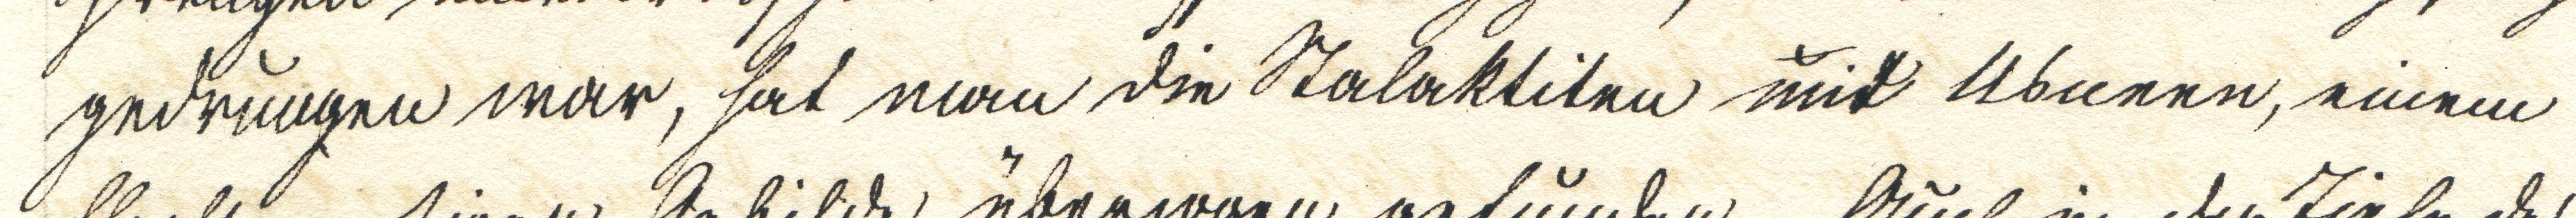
gedrungen war, hat man die Stalaktiten undmit Usneen, einem
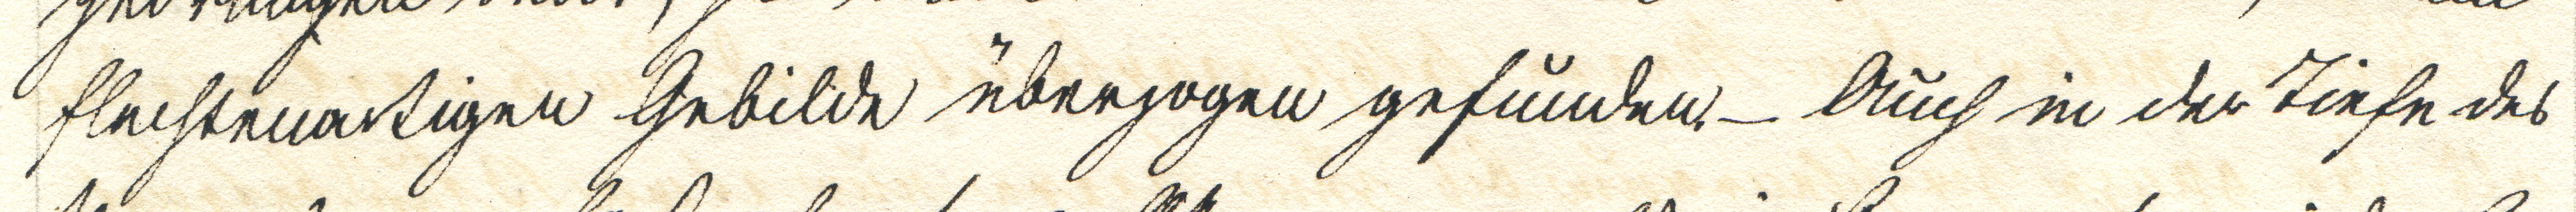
flechtenartigen Gebilde überzogen gefunden. – Auch in der Tiefe des
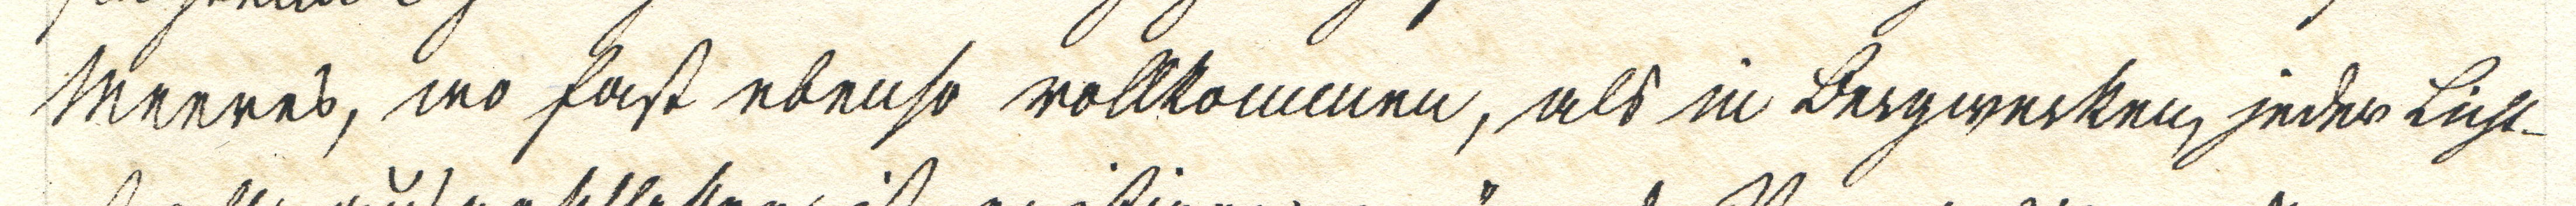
Meeres, wo fast ebenso vollkommen, als die Bergwerken, jeder Licht-
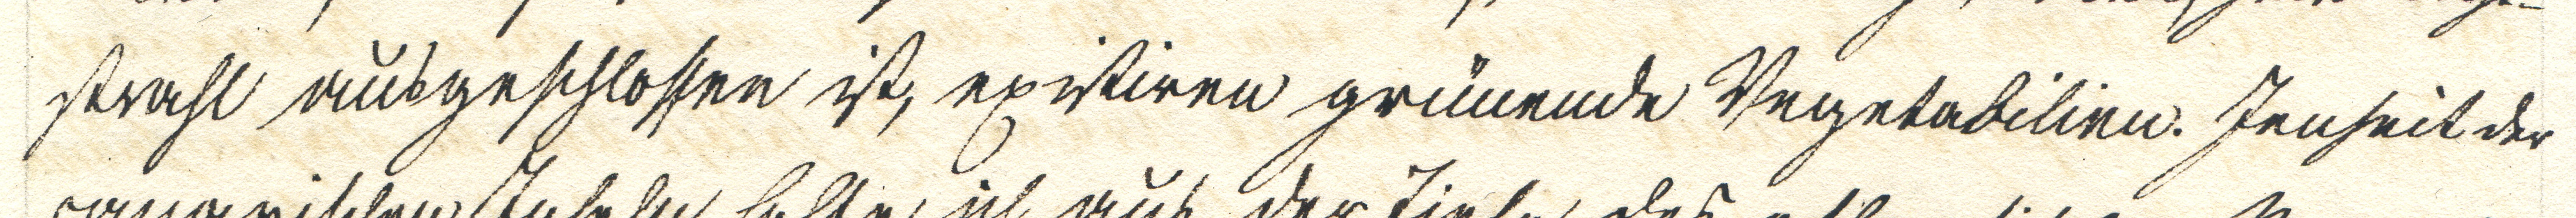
strahl ausgeschlossen ist, existiren grünende Vegetabilien. Jenseit der
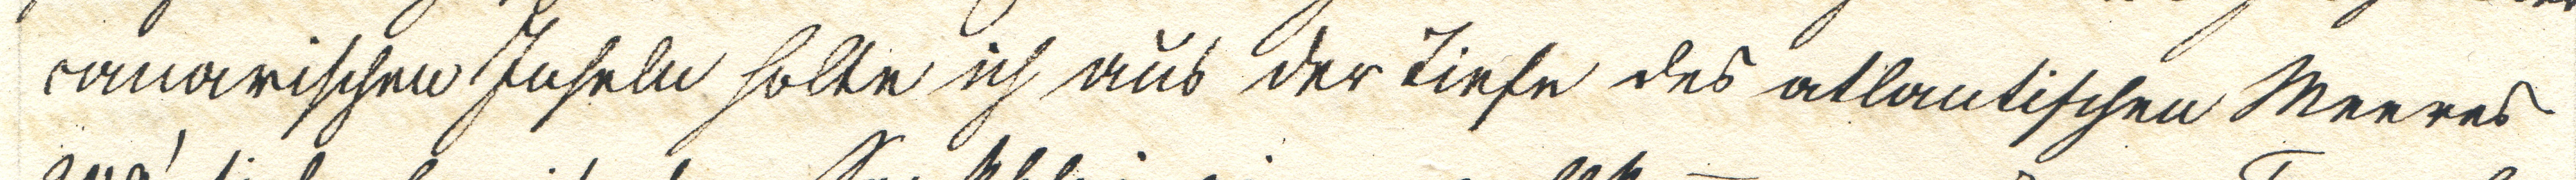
canarischen Inseln holte ich aus der Tiefe des atlantischen Meeres
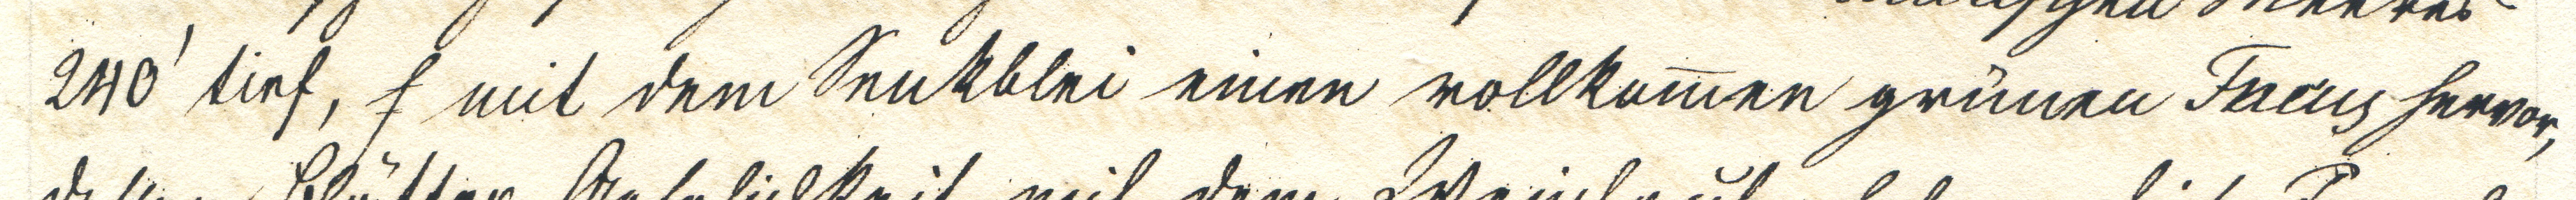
240′ tief, h mit dem Senkblei einen vollkom̃en grünen Feucus hervor,
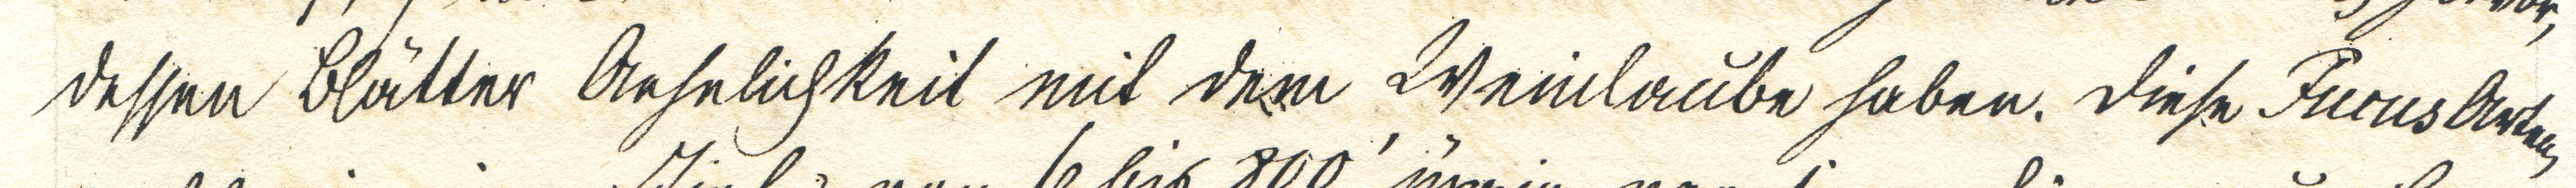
dessen Blätter Aehnlichkeit mit dem Weinlaube haben. Diese FucusArten,
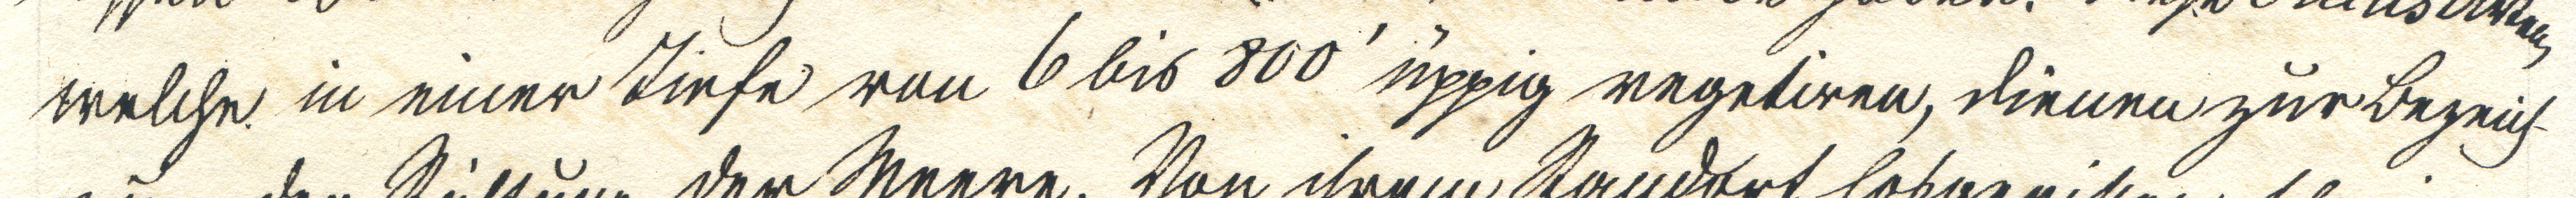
welche in einer Tiefe von 6 bis 800′ üppig vegetiren, dienen zur Bezeich-
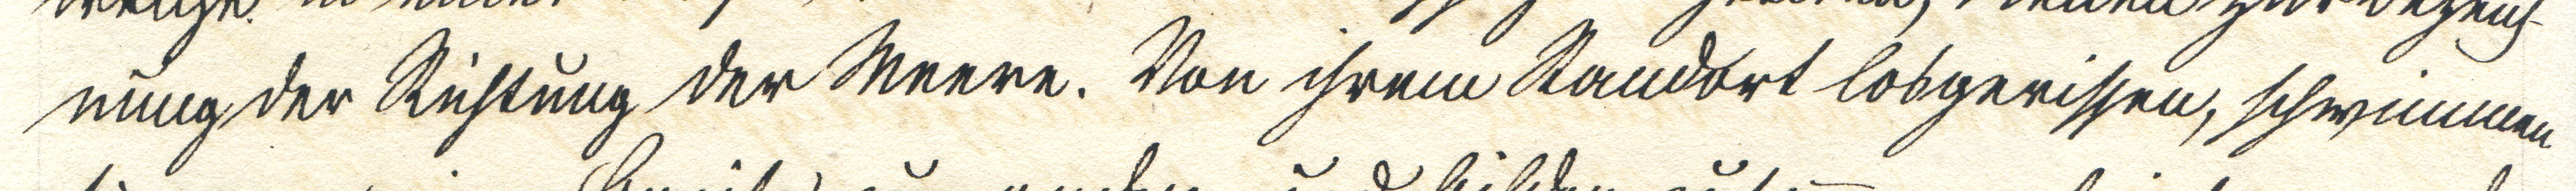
nung der Richtung der Meere. Von ihrem Standort losgerissen, schwimmen
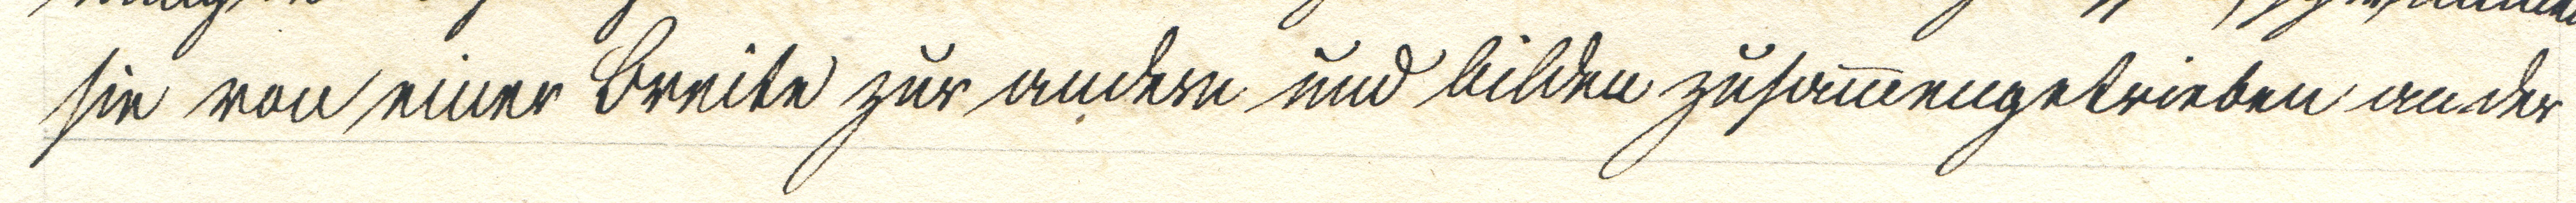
sie von einer Breite zur andern und bilden zusam̃engetrieben an der
